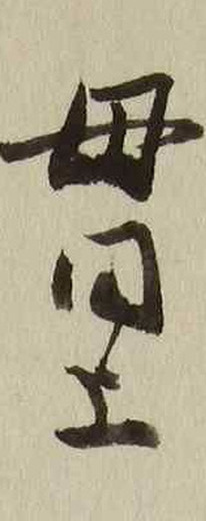母同上
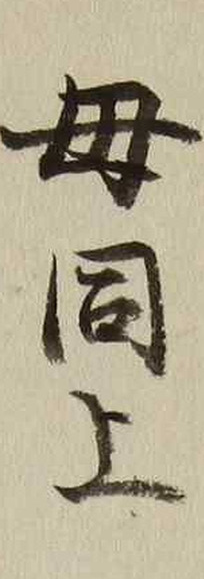母同上
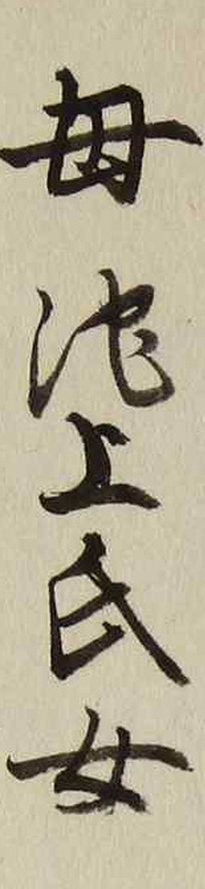母池上氏女
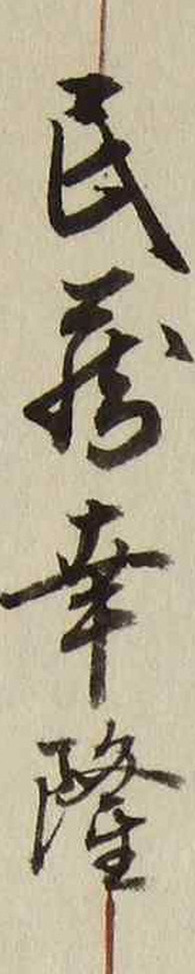民蔵幸隆

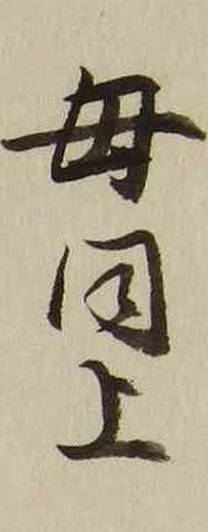母同上
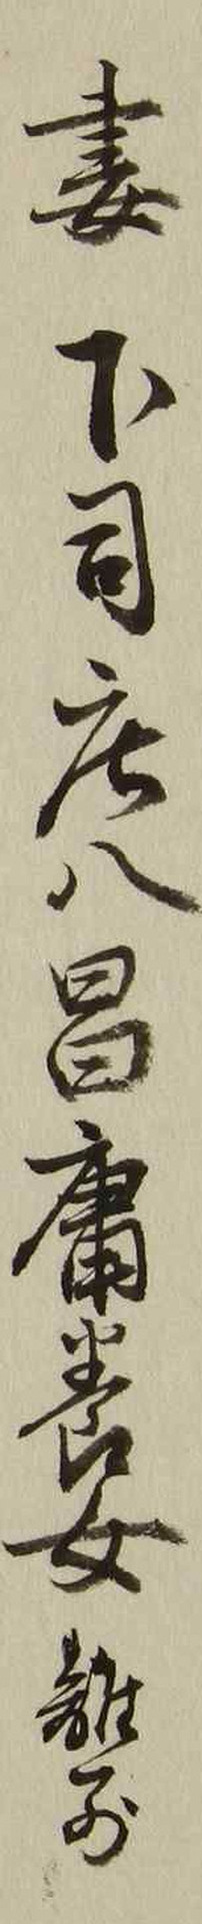妻下司庄八昌庸養女離別
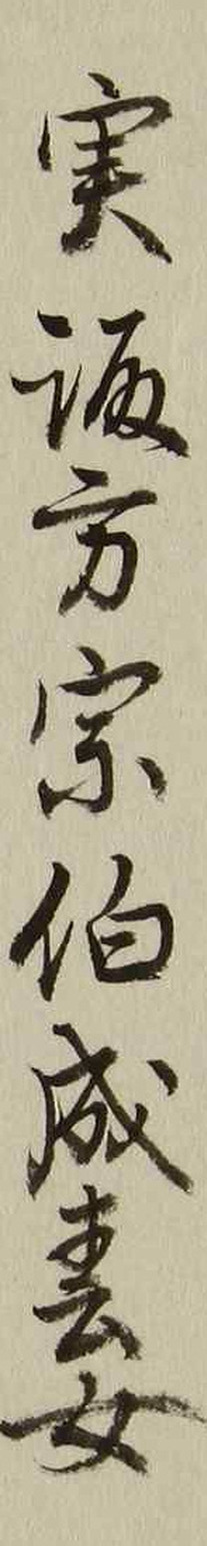実諏方宗伯成春女
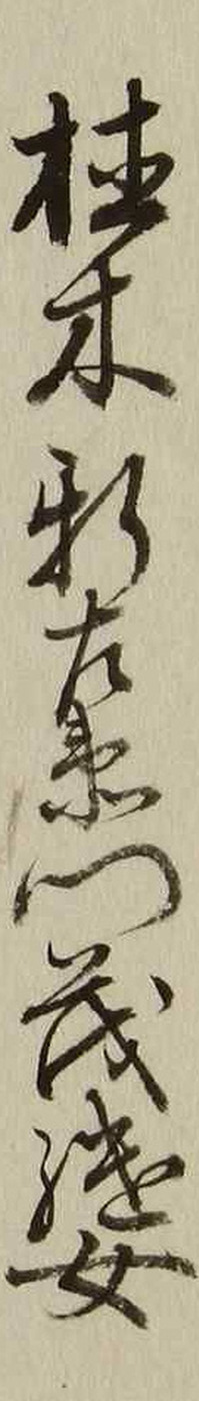植木新左衛門茂継女
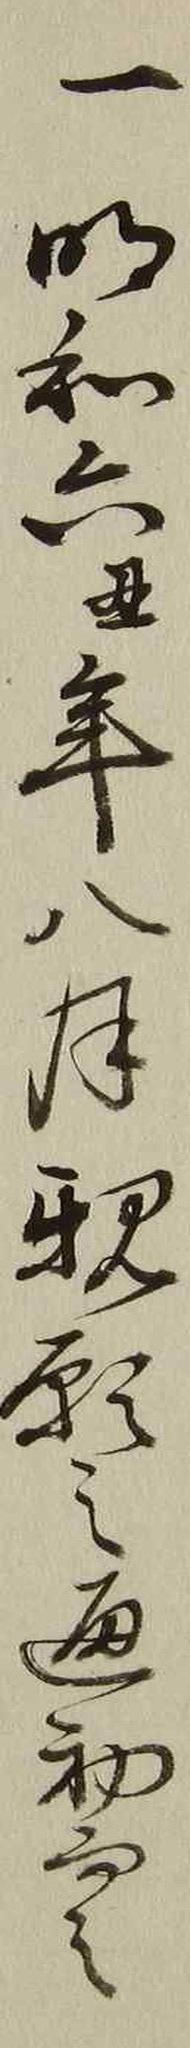一明和六丑年八月親願之通初而之
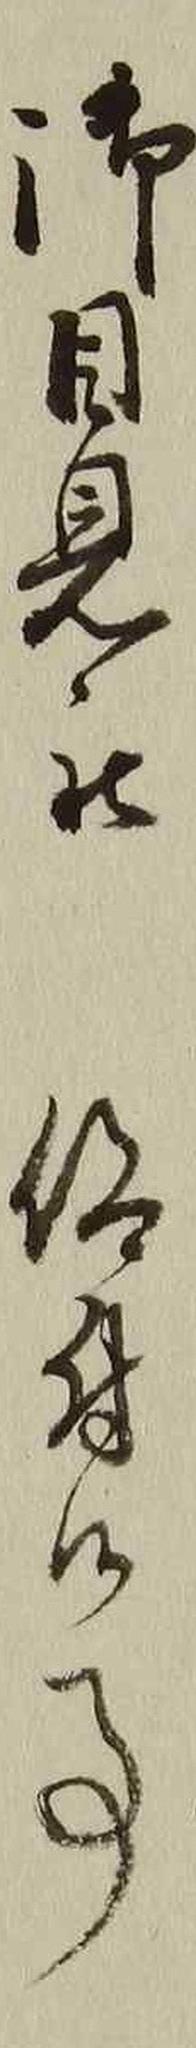御目見被仰付候事
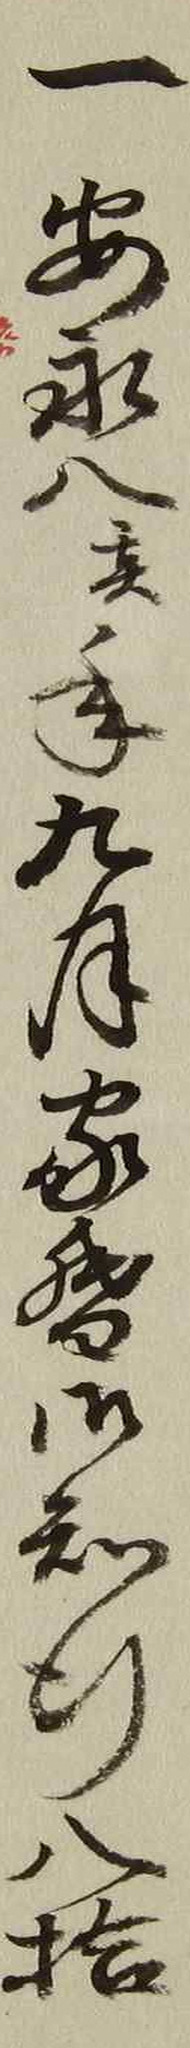一安永八亥年九月家督御知行八拾
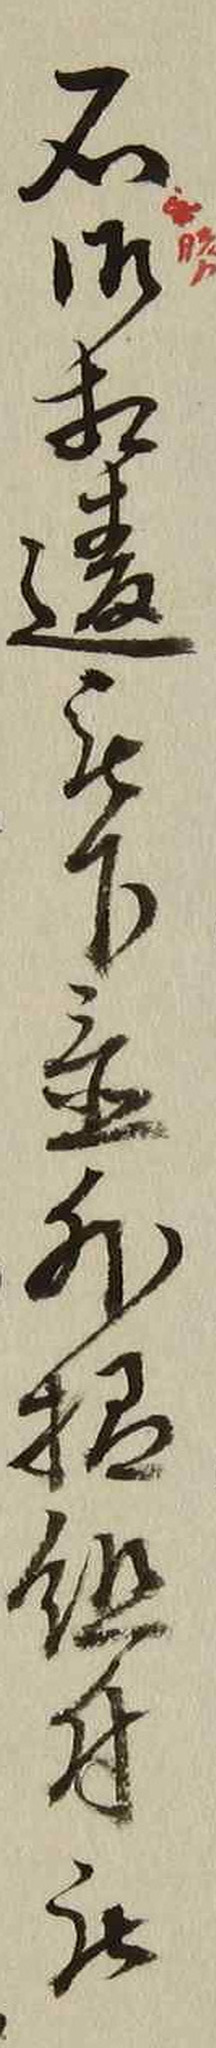石御相違被下置外様組付被
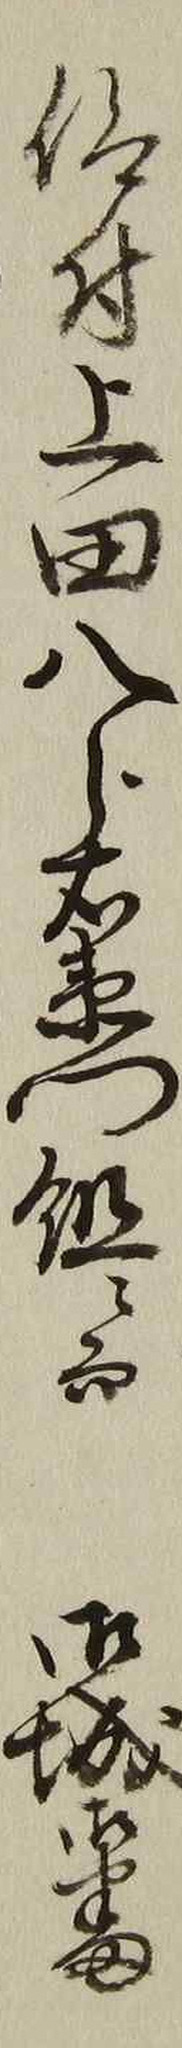仰付上田八郎右衛門組ニ而御城御番
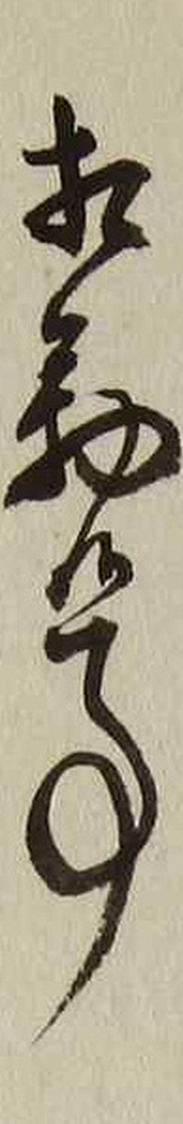相勤候事
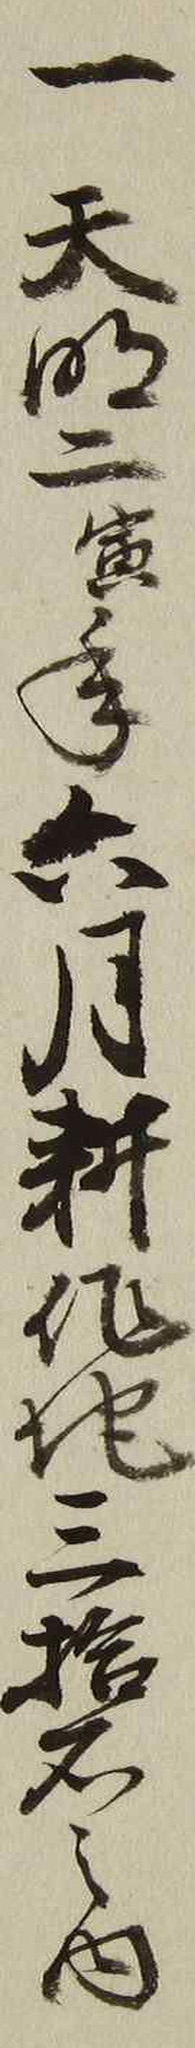一天明二寅年六月耕作地三拾石之内
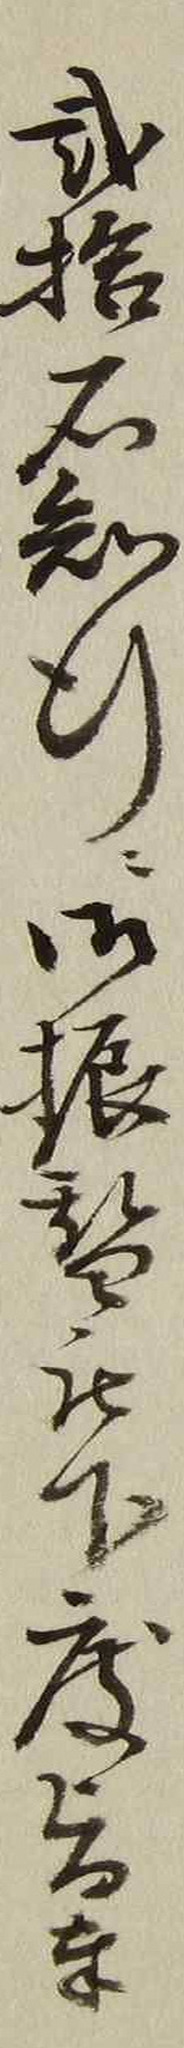弐拾石知行ニ御振替被下度旨奉
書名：諸士系譜　巻之35　は之部3
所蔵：会津若松市立会津図書館
